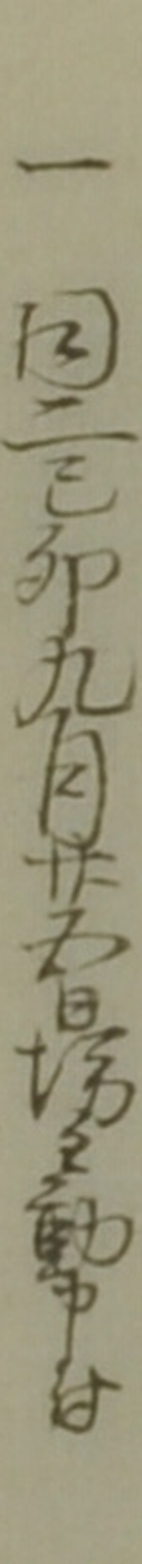一同二己卯九月廿五日坊主勤申付
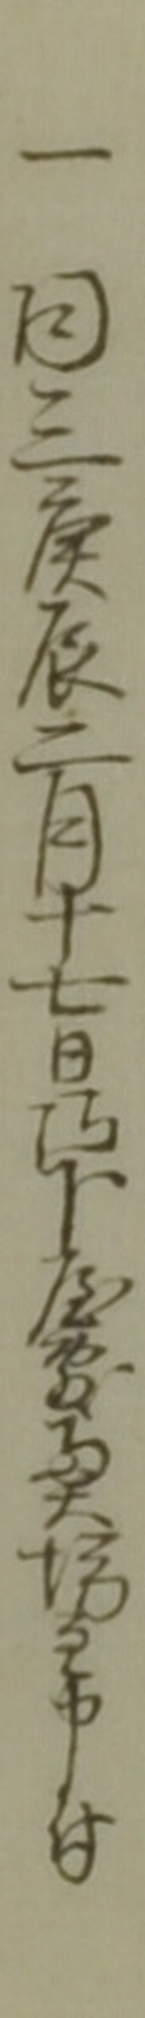一同三庚辰二月十七日御下屋敷奥坊主申付
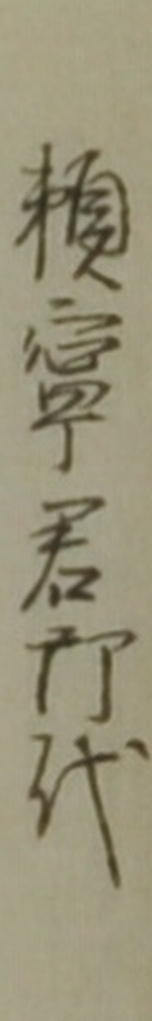頼寧君御代
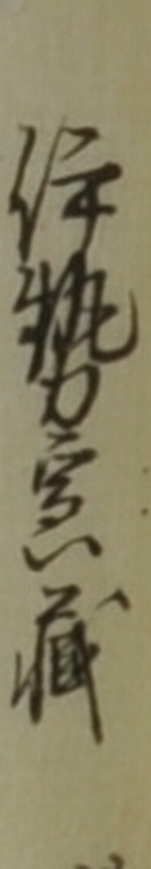伊勢寅蔵
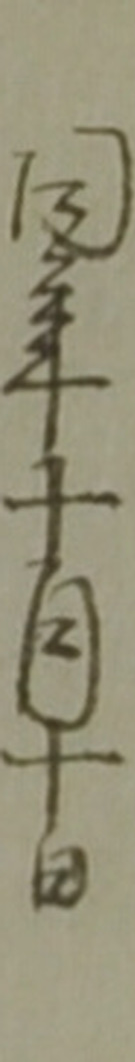一同年十月十日
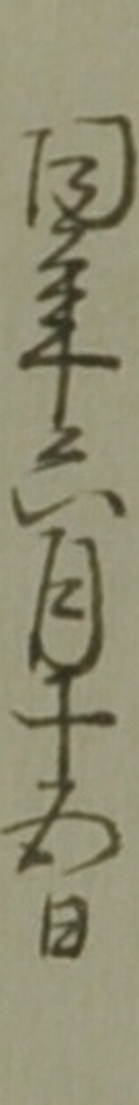一同年六月十五日
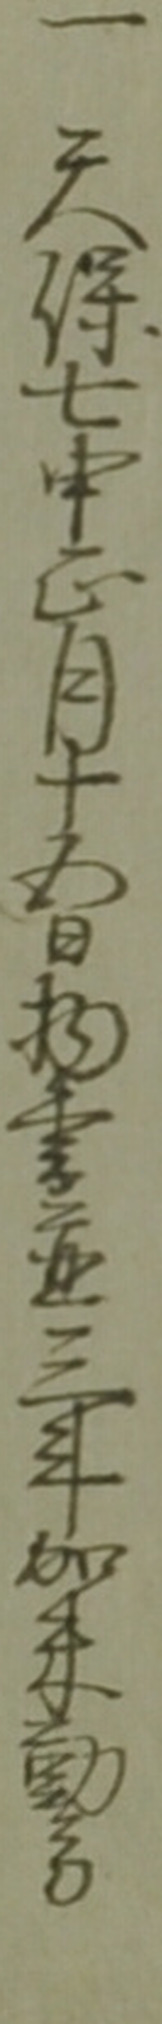一天保七申正月十五日物書並三斗加米勤方
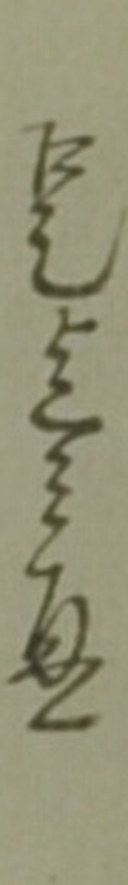是迄之通
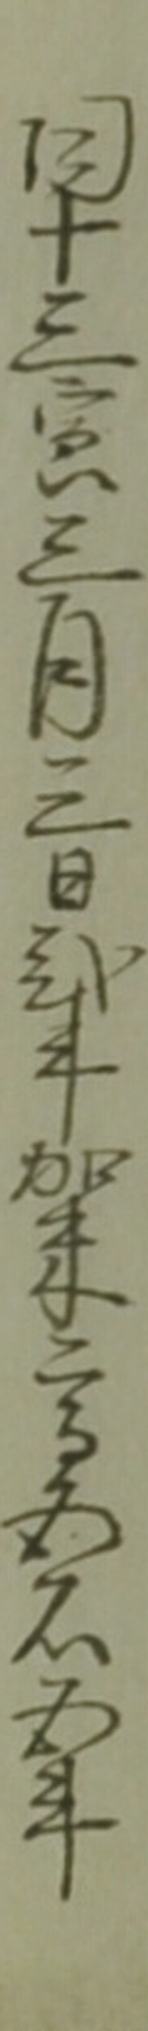一同十三寅三月三日弐斗加米高五石五斗
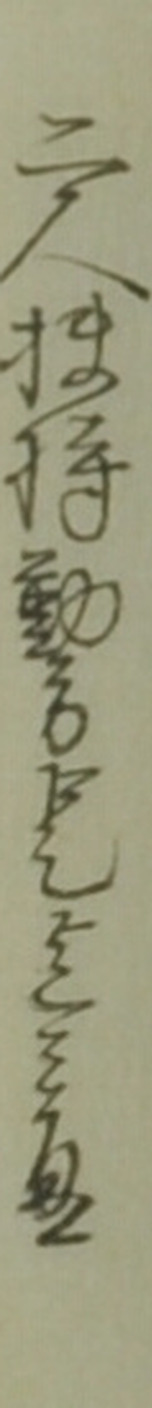二人扶持勤方是迄之通

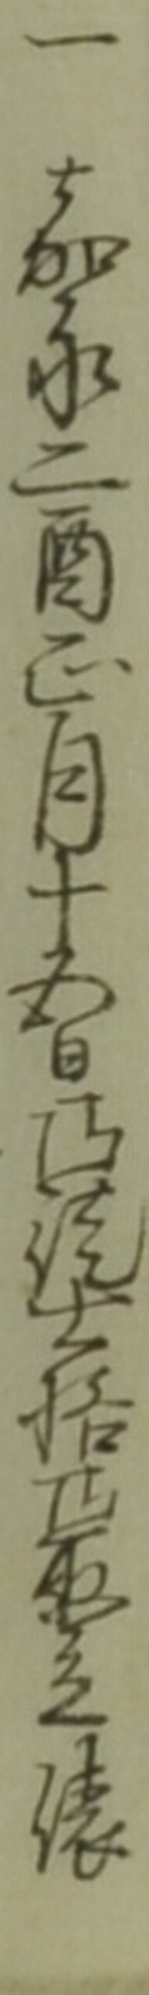一嘉永二酉正月十五日御徒士格御取立俵
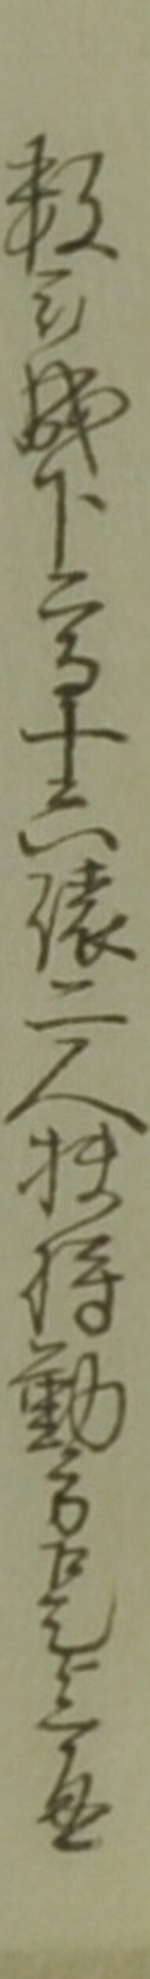数被被成下高十六俵二人扶持勤方是迄通
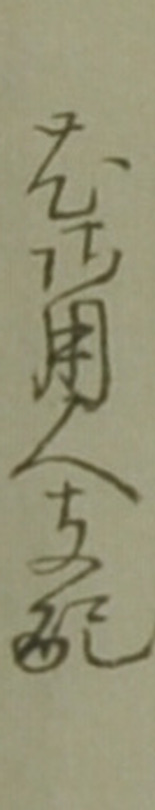尤御用人支配

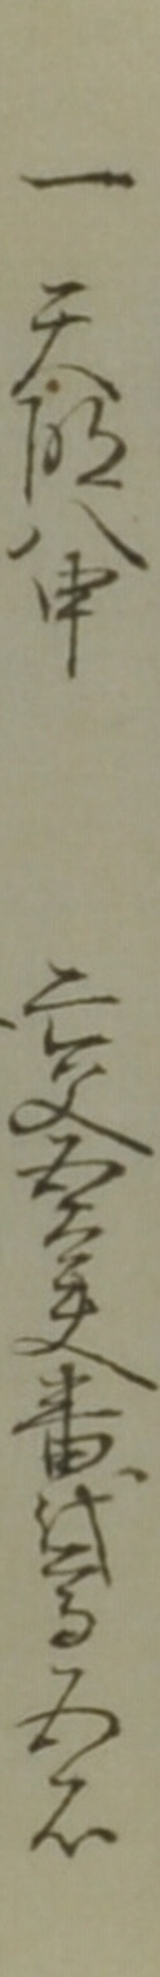一天明八申亡父五太夫番代高五石
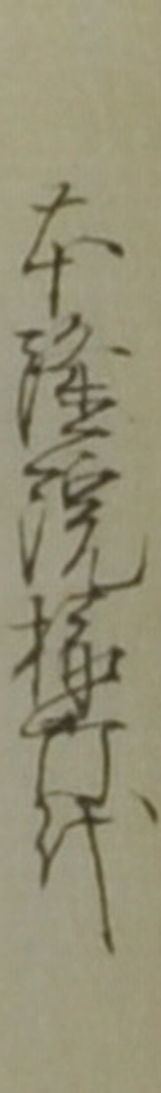本隆院様御代
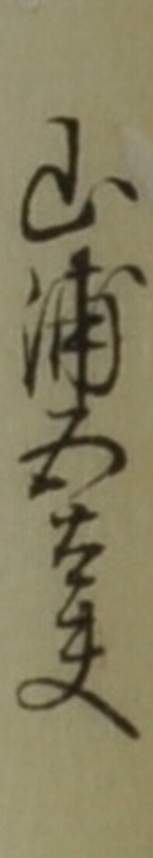山浦五太夫
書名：無足諸士勤仕録（八）
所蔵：伊那市立高遠町図書館・合同会社AMANE
